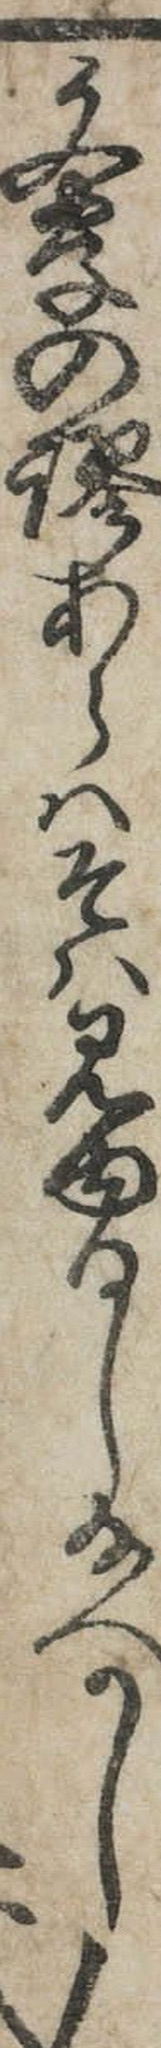文字の謬あらはそは見ゆるし給へかし

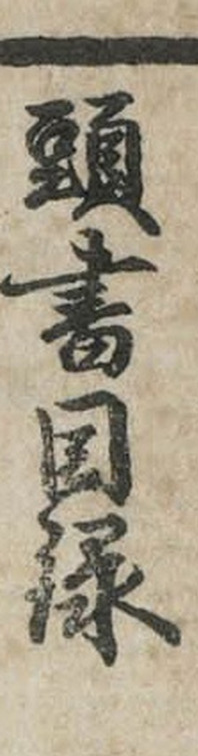頭書目録
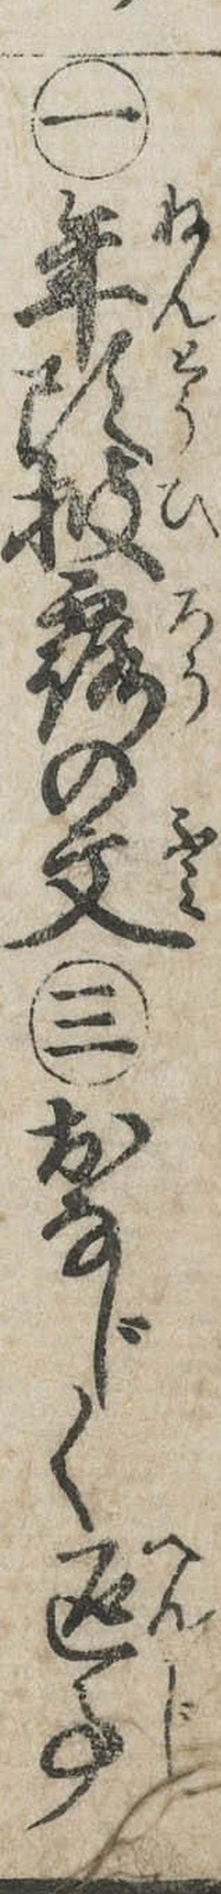(一)年頭披露の文(三)おなじく返事
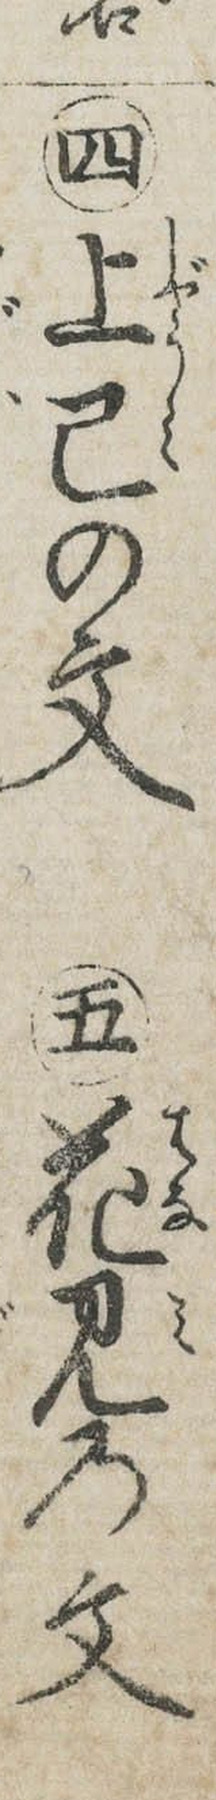(四)上巳の文(五)花見の文
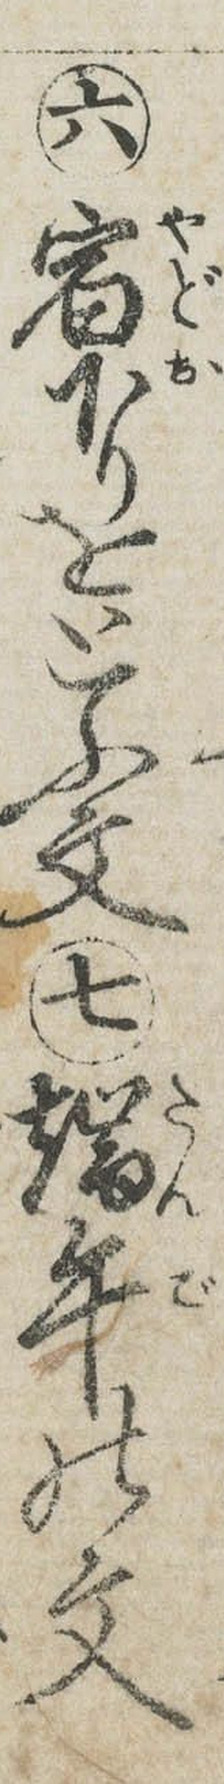(六)宿下りをとふ文(七)端午の文
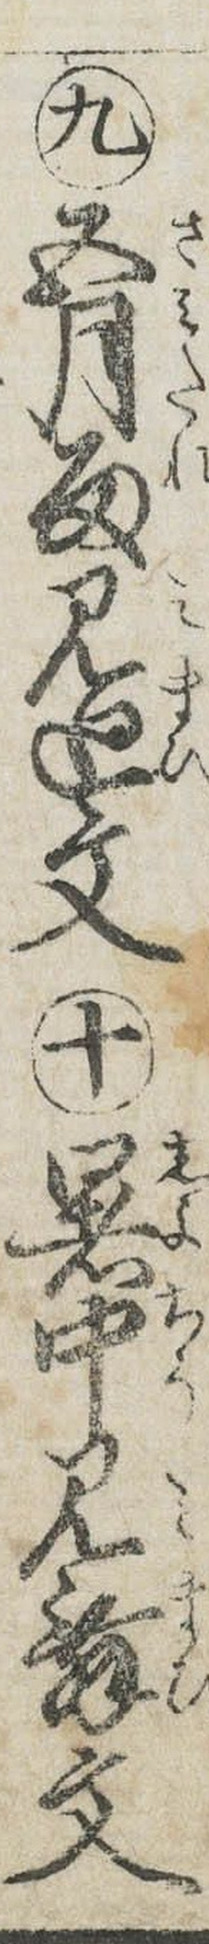(九)五月雨見廻文(十)暑中見舞文
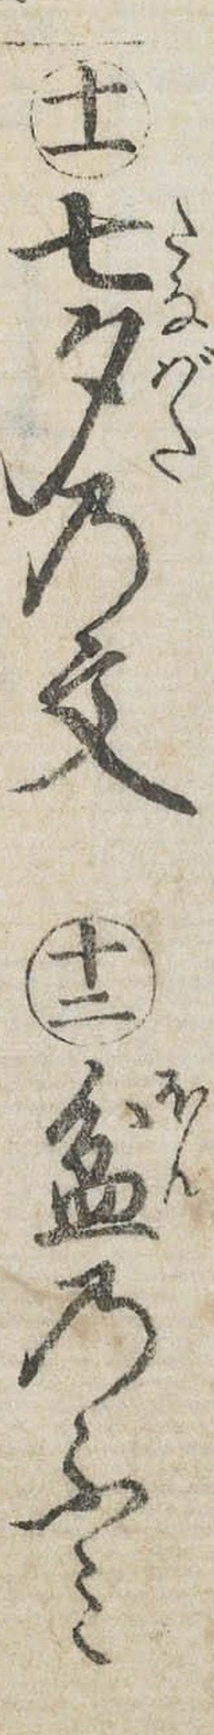(十一)七夕の文(十二)盆のふみ
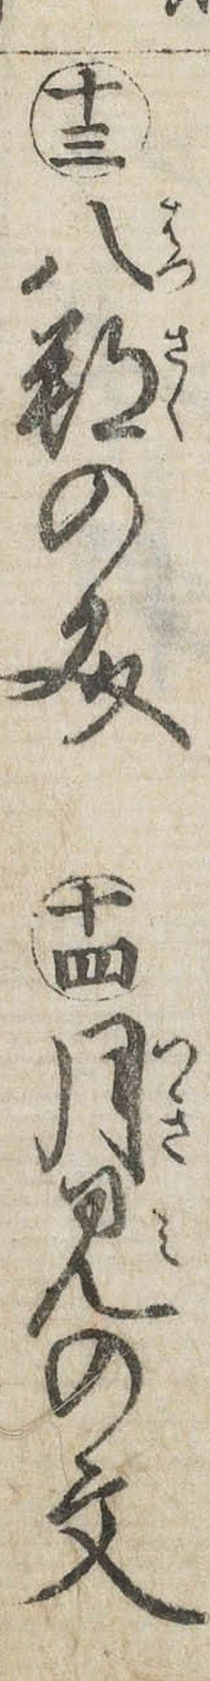(十三)八朔の文(十四)月見の文
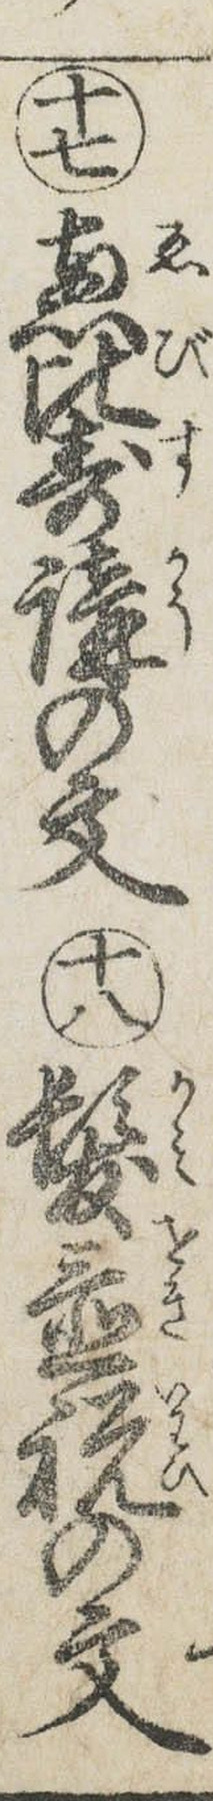(十七)恵比寿講の文(十八)髪置祝の文
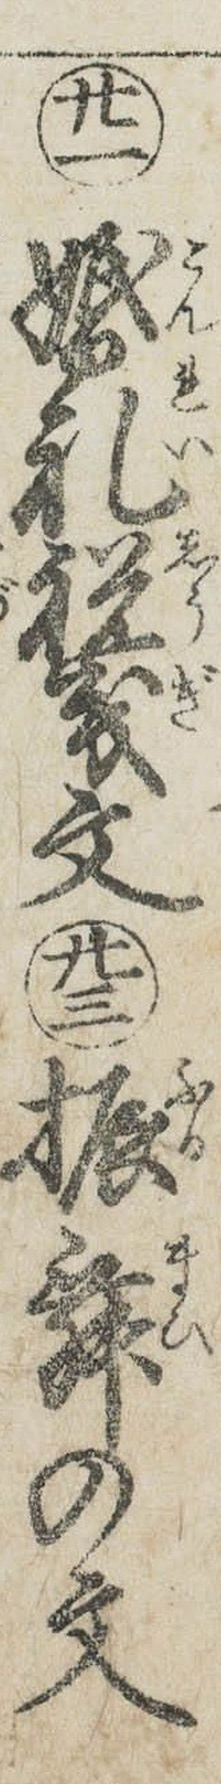(廿一)婚礼祝義文(廿三)振舞の文
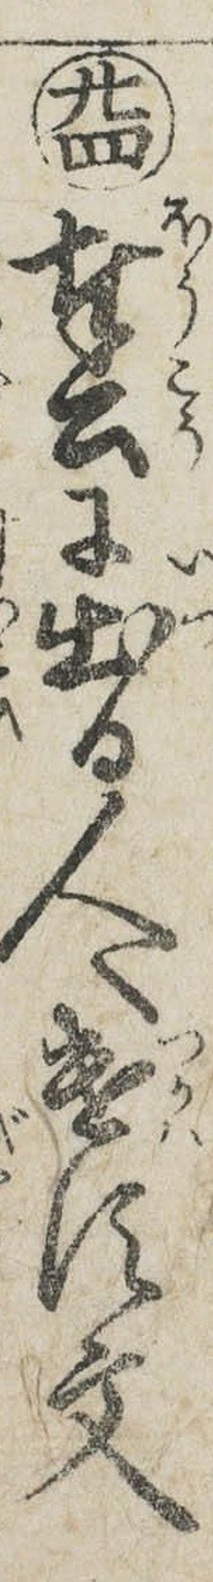(廿四)奉公に出る人へ遣す文
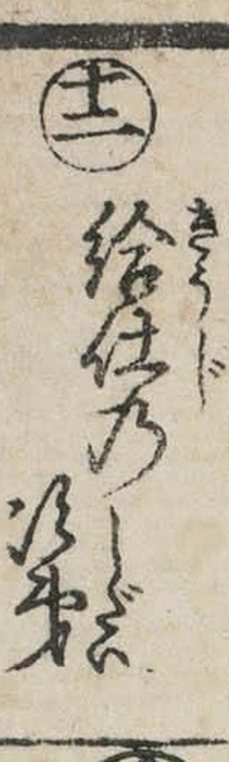(十二)給仕の次第
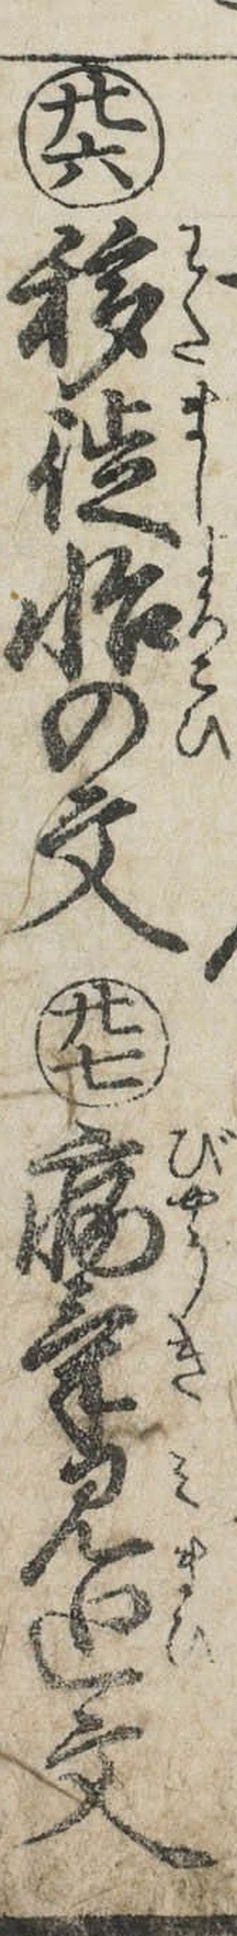(廿六)移徙怡の文(廿七)病気見廻文

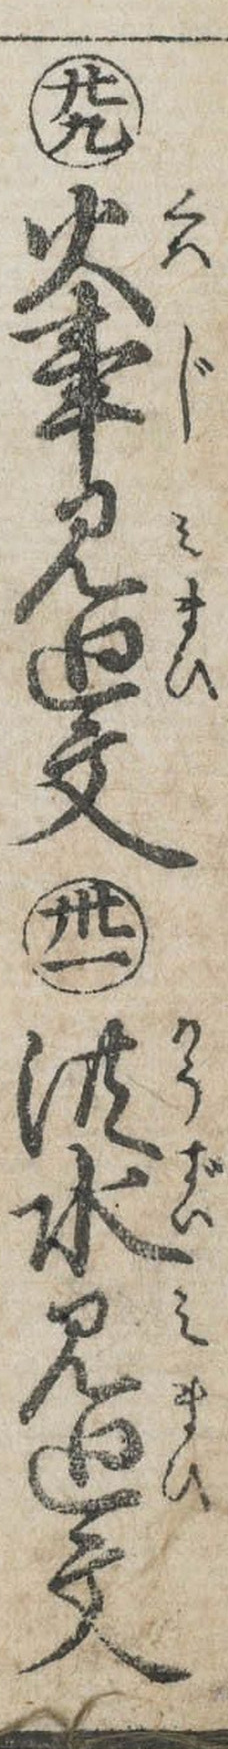(廿九)火事見廻文(卅一)洪水見廻文
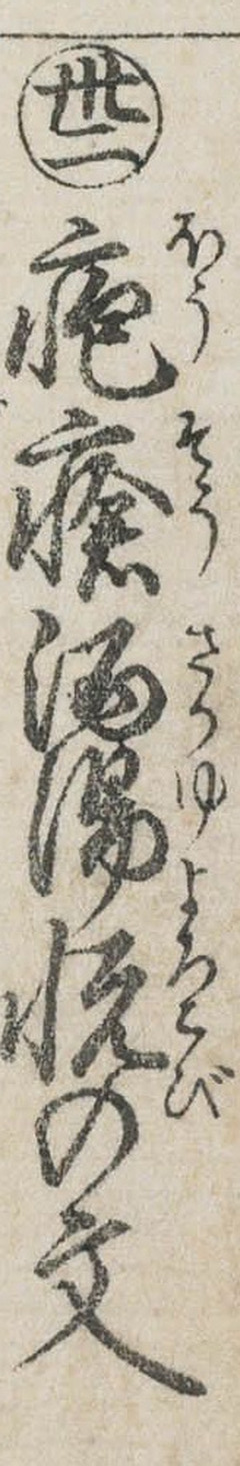(卅二)疱瘡酒湯悦の文
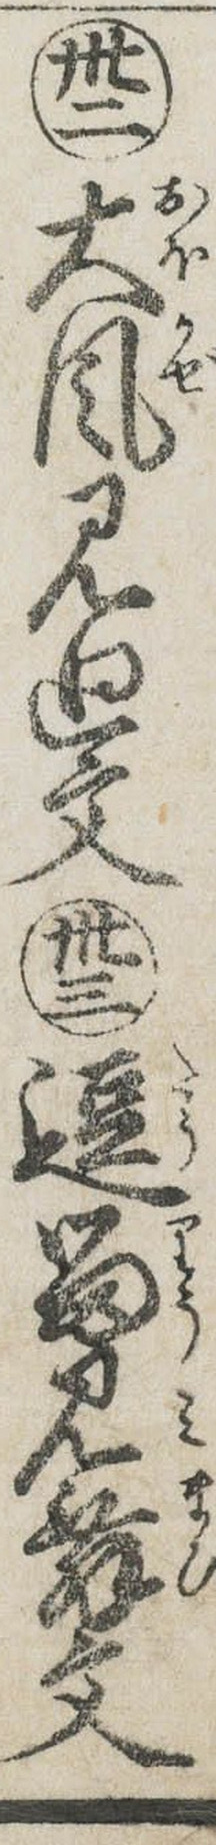(卅二)大風見廻文(卅三)逗留見舞文
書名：頭書萬用婦人手紙之文言
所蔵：東京学芸大学教育コンテンツアーカイブ
